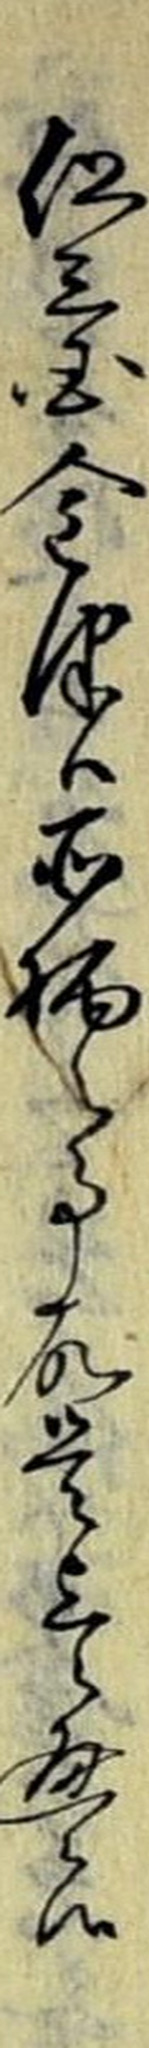但三国金津ハ所柄之事故是迄之通ニ候
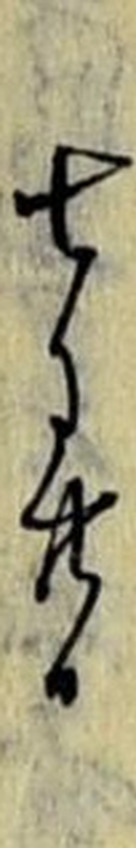七月廿日
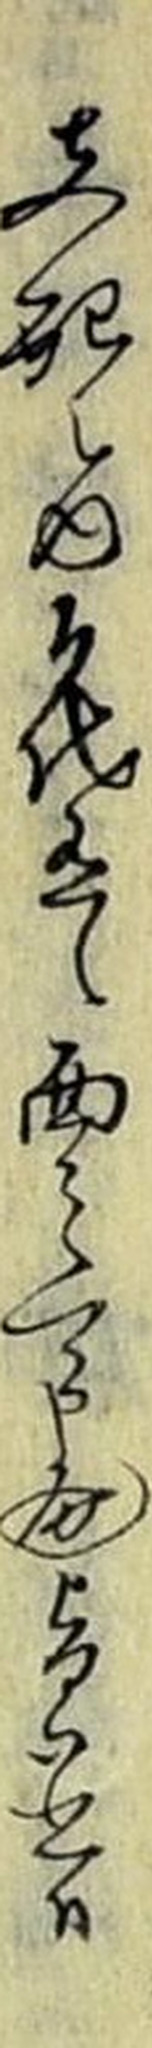支配之内下代有之面々へ可申通旨御書付御目付
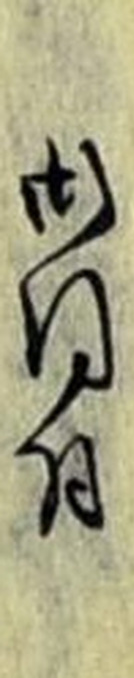御目付
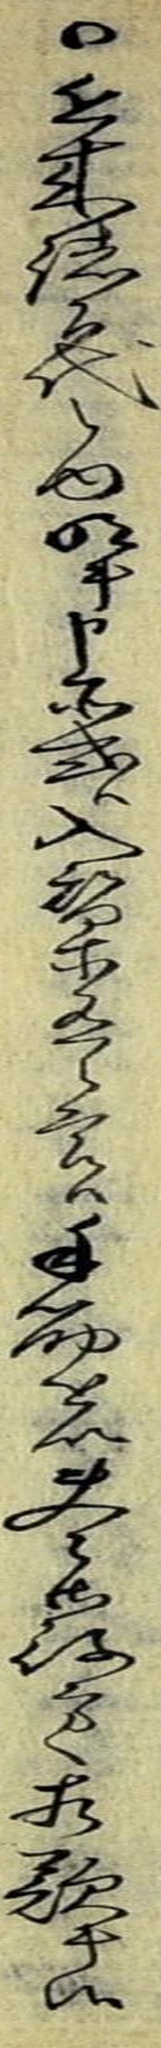〇近来諸下代之内明キ申所或ハ入替等有之節ハ手筋を以夫々御役方へ相歎キ候
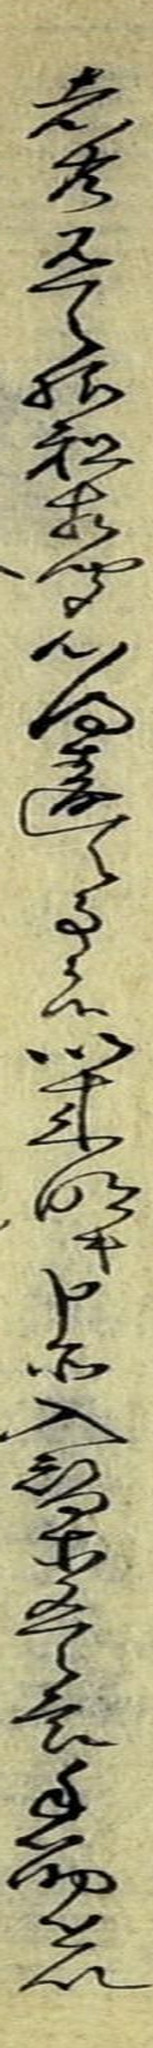者共有之様粗相聞心得違之事ニ候以来明キ申所入替等有之節手筋を以
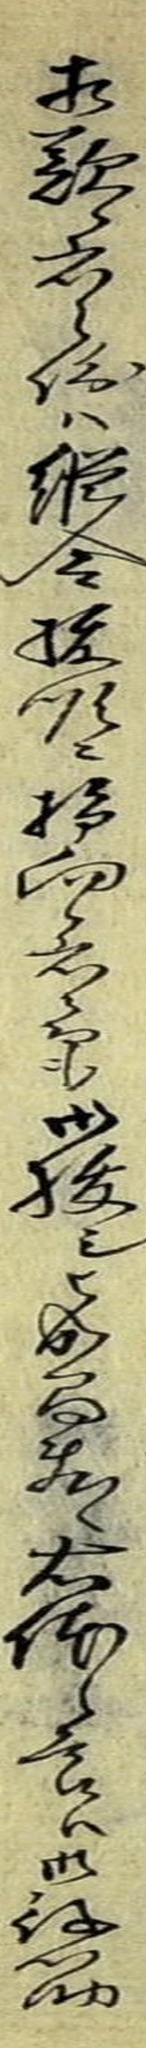相歎候者之儀ハ縦令抜順ニ指向候者ニ而も御抜シ被成間敷候右体之節ハ御役筋
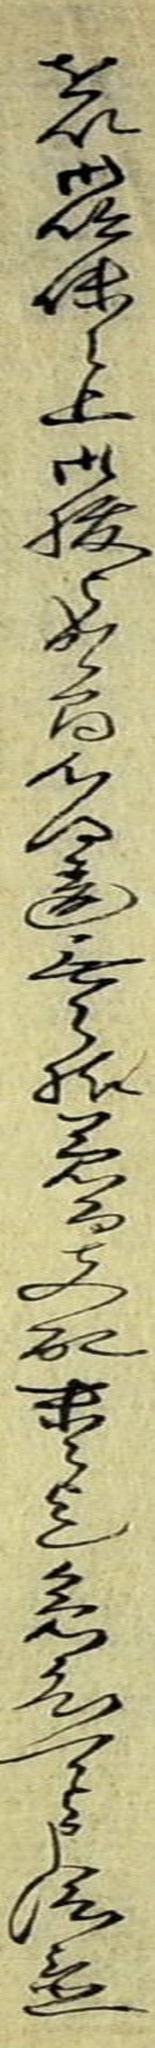を以御吟味之上御抜被成候間心得違無之様兼而支配末々迄急度可被申渡置
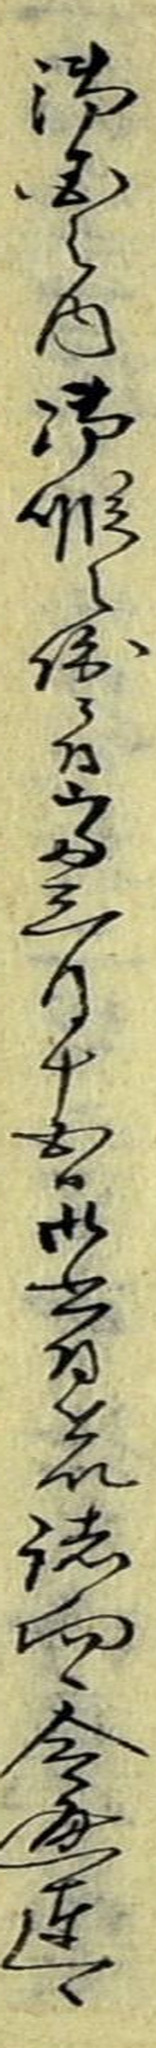御国之内御暇之儀ニ付三月十五日御書付を以諸向へ令通達候
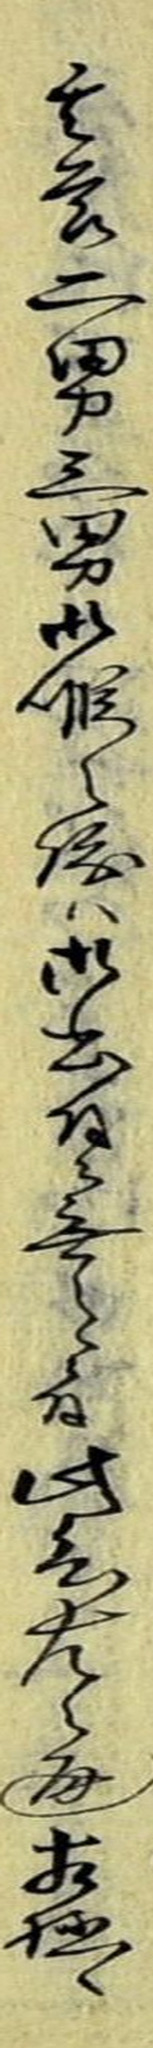其節二男三男御暇之儀ハ御書付ニ無之候ニ付此度左之通相極候

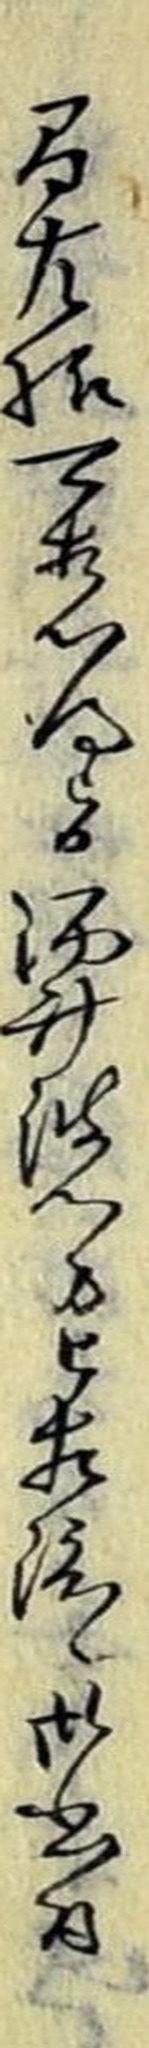間左様可相心得旨酒井波門方被相渡候御書付
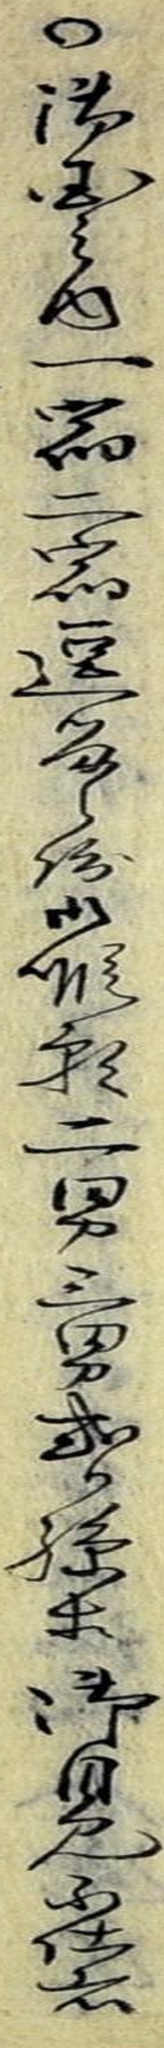〇御国之内一宿二宿逗留之儀御暇願二男三男或ハ孫等御目見不仕者
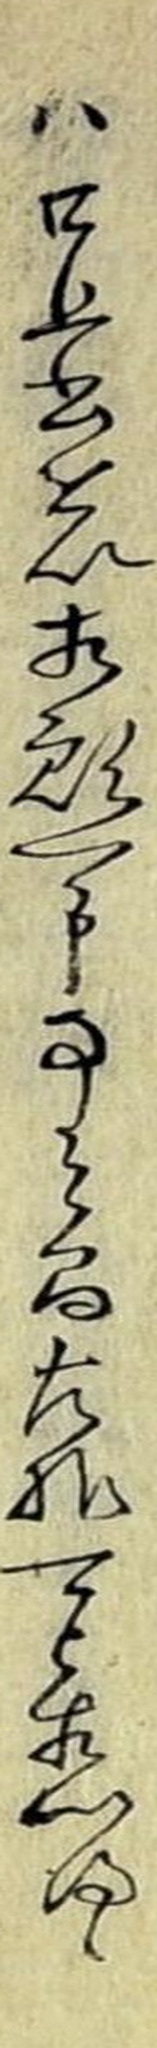ハ口上書を以相願可申事ニ候間左様可被相心得候
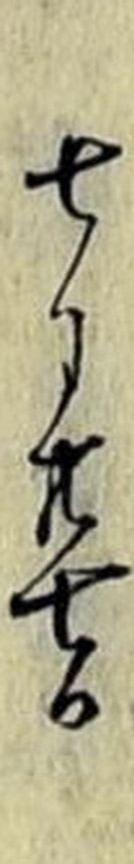七月廿七日
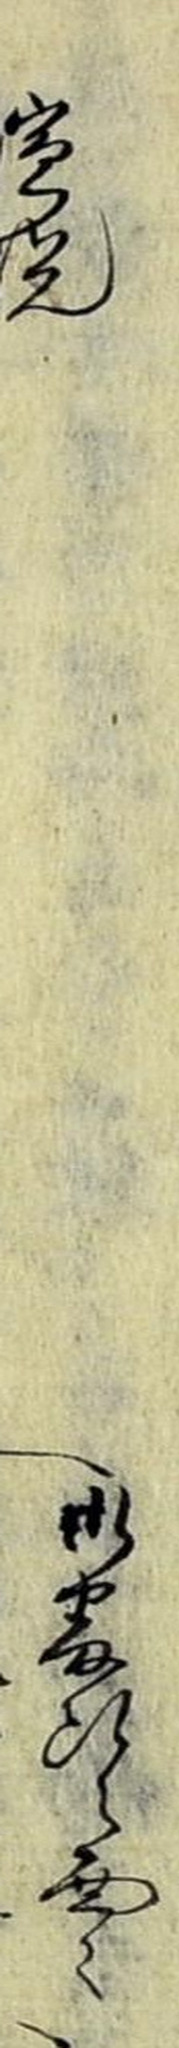演説御番頭之面々
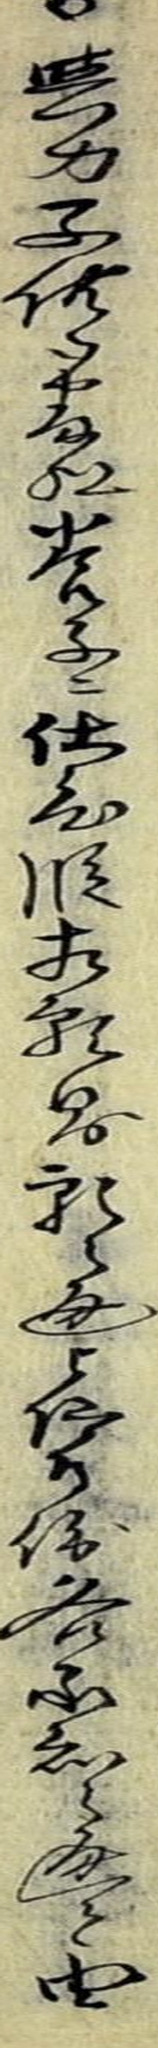〇与力子供御番組養子ニ仕度段相願則願之通被仰付儀各承知之通ニ候由
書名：命令之部 三
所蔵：福井県文書館 Fukui Prefectural Archives
